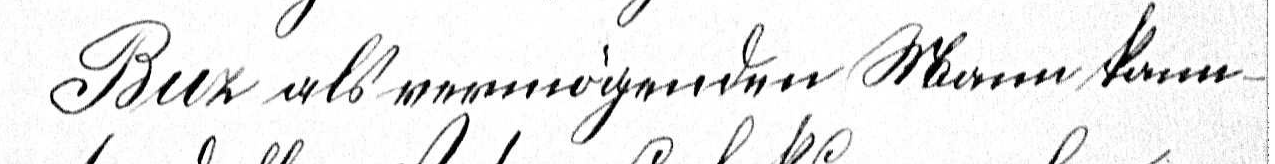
Buz als vermögenden Mann kann¬
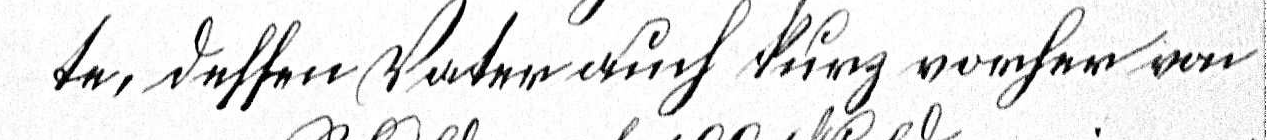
te, dessen Vater auch kurz vorher an
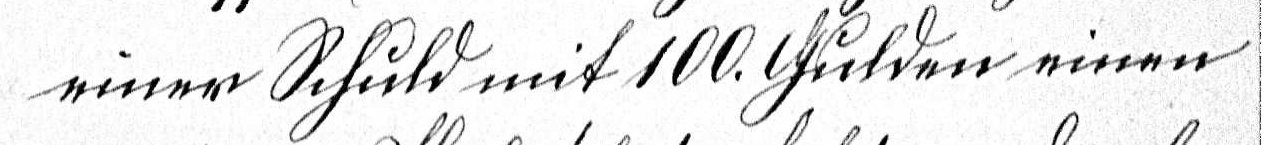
einer Schuld mit 100 Gulden einen
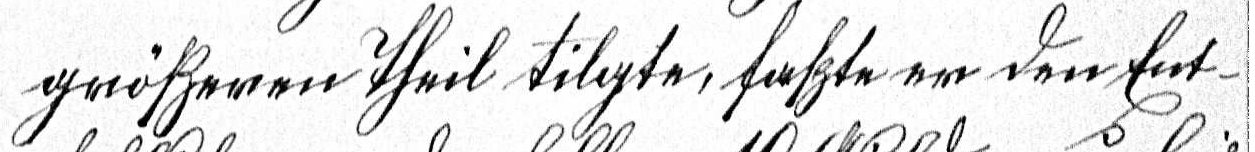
größeren Theil tilgte, faßte er den Ent¬
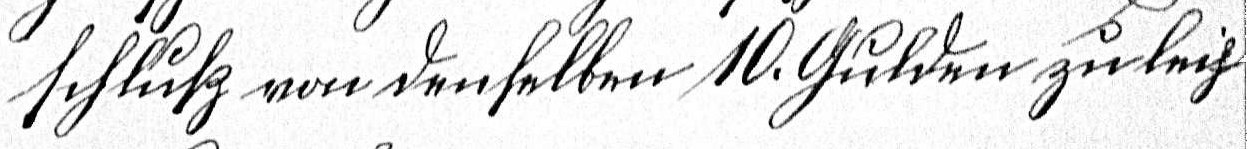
schluß von denselben 10 Gulden zu leih¬
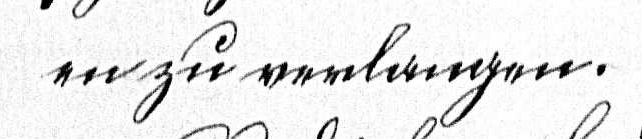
en zu verlangen.
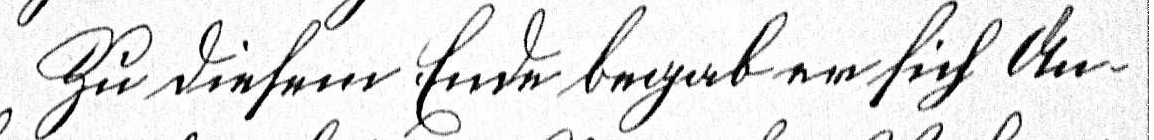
Zu diesem Ende begab er sich An¬
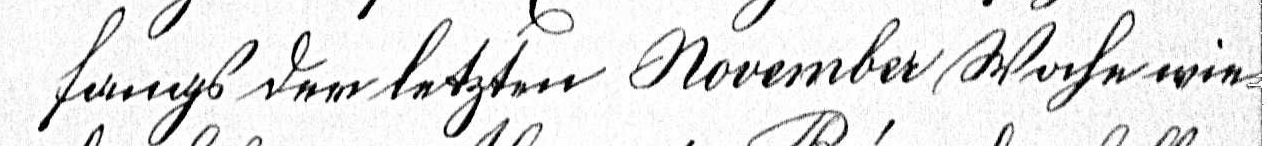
fangs der letzten November Woche wie¬
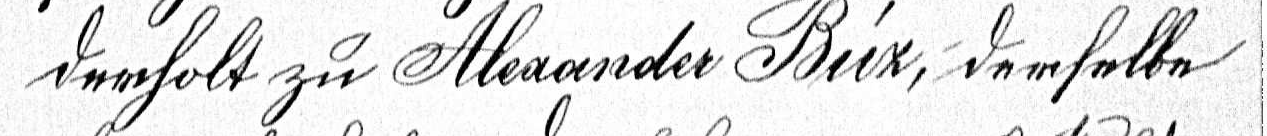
derholt zu Alexander Búz, derselbe
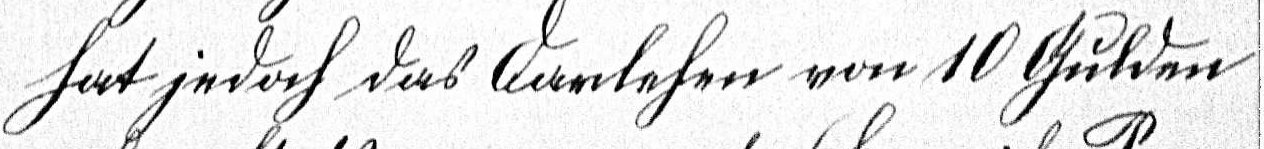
hat jedoch das Darlehen von 10 Gulden
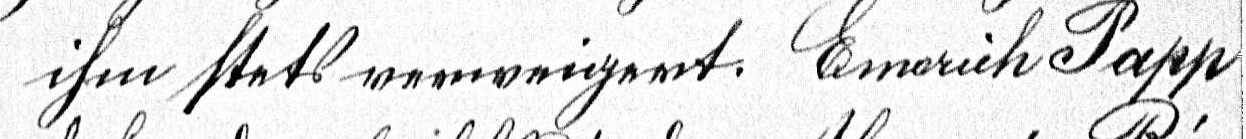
ihm stets verweigert. Emerich Papp
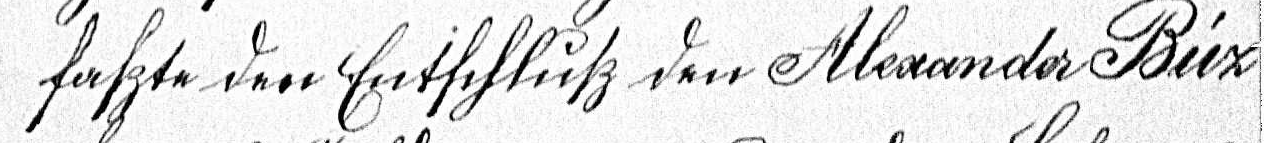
faßte den Entschluß den Alexander Búz
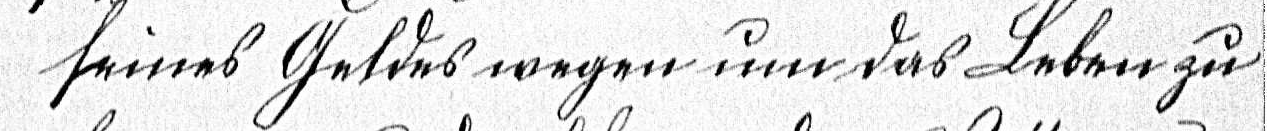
seines Geldes wegen um das Leben zu
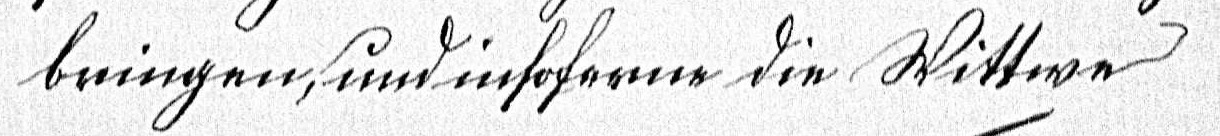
bringen, und insoferne die Wittwe
